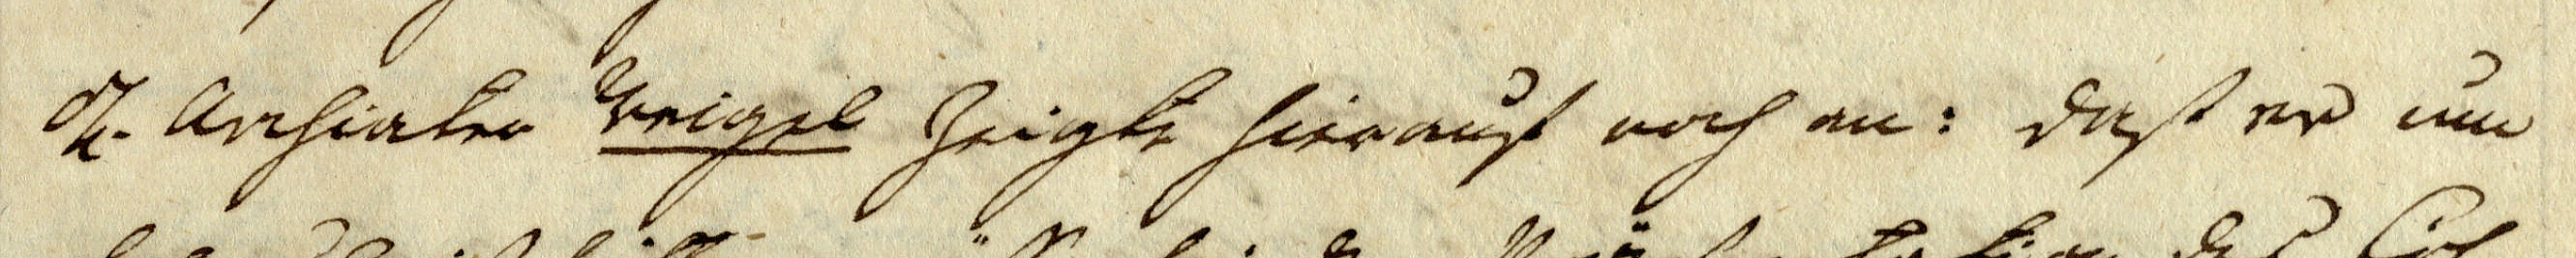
dh. Archiater Weigel zeigte hierauf noch an: daß er um
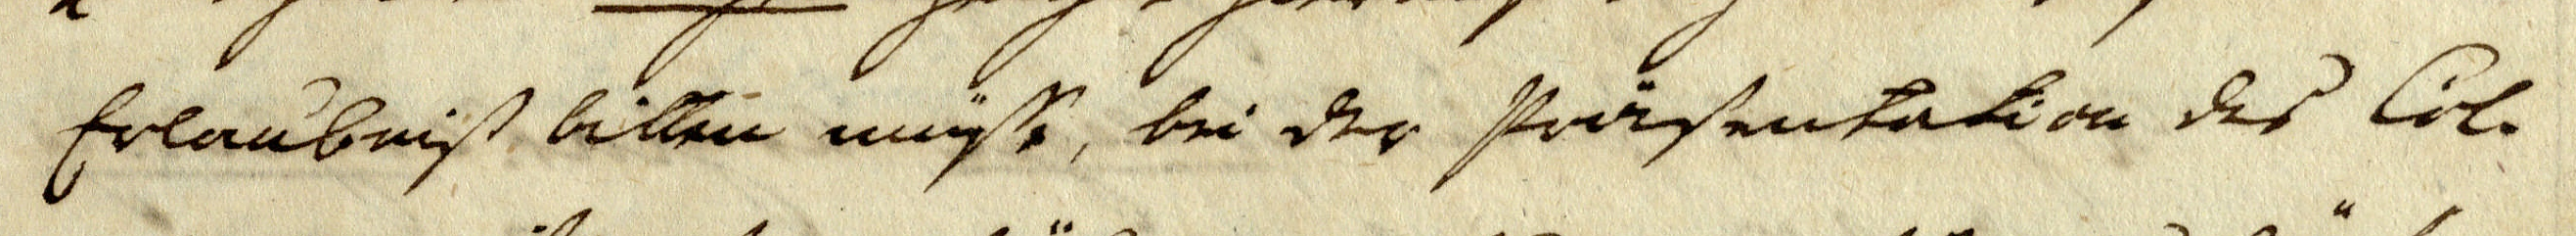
Erlaubniß bitten müsse, bei der Präsentation des Col¬
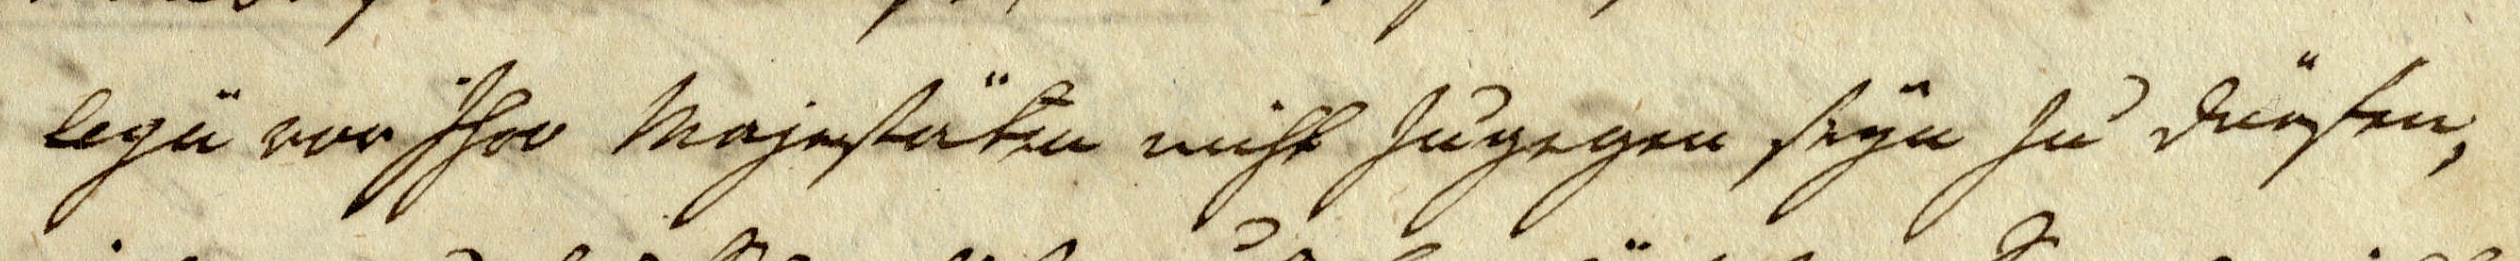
legii vor Ihro Majestäten nicht zugegen seÿn zu dürfen,
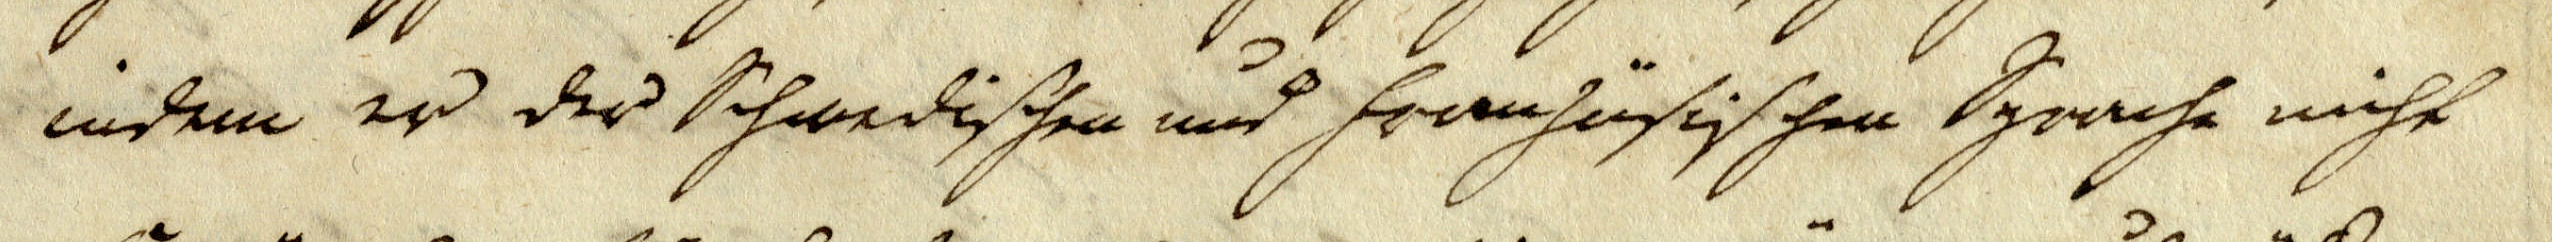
indem er der Schwedischen und Französischen Sprache nicht
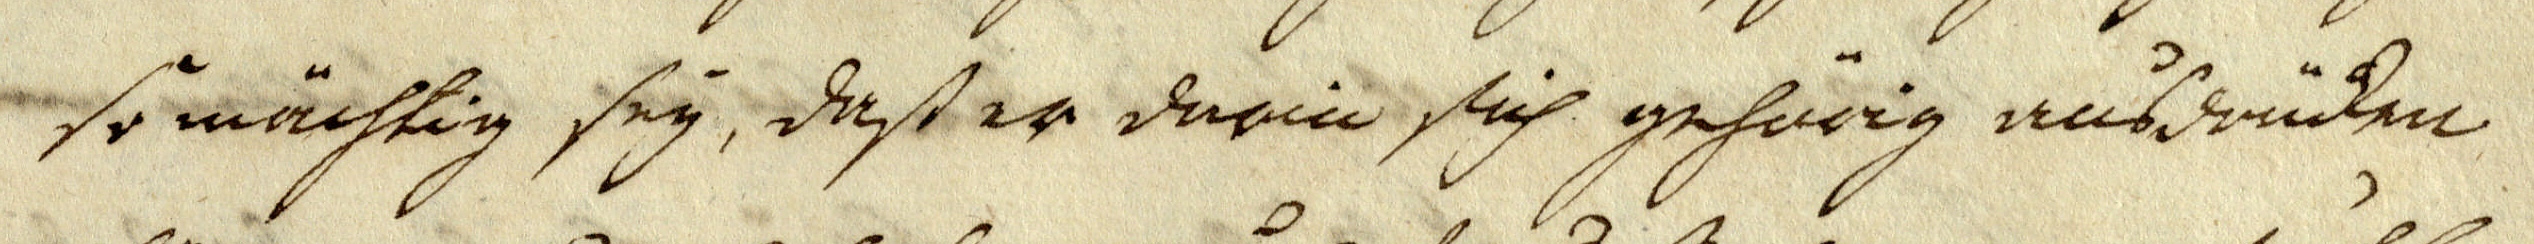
so mächtig seÿ, daß er darin sich gehörig ausdrücken
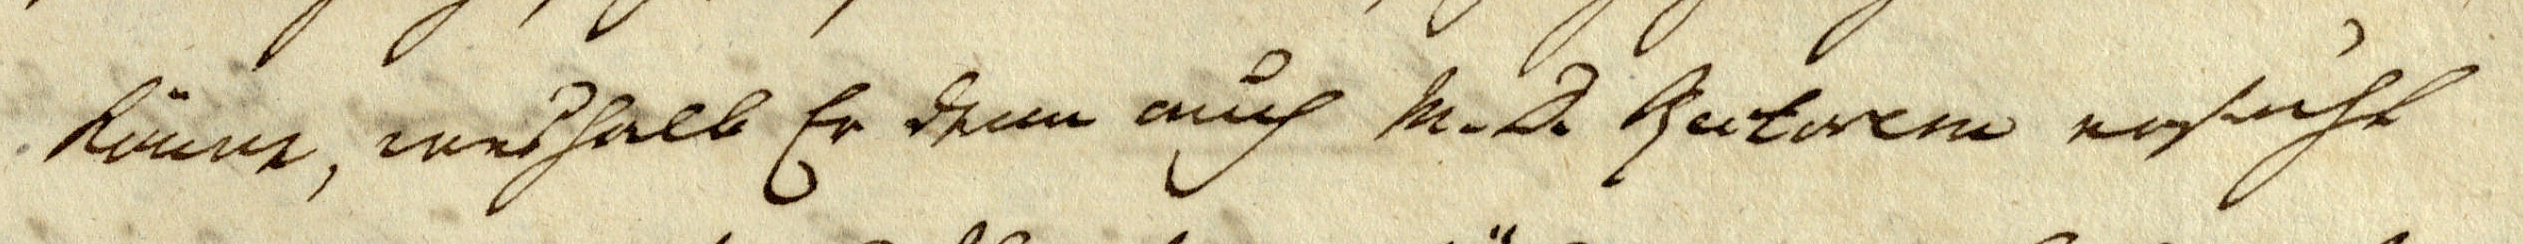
könne, weshalb Er denn auch M. D. Rectorem ersucht
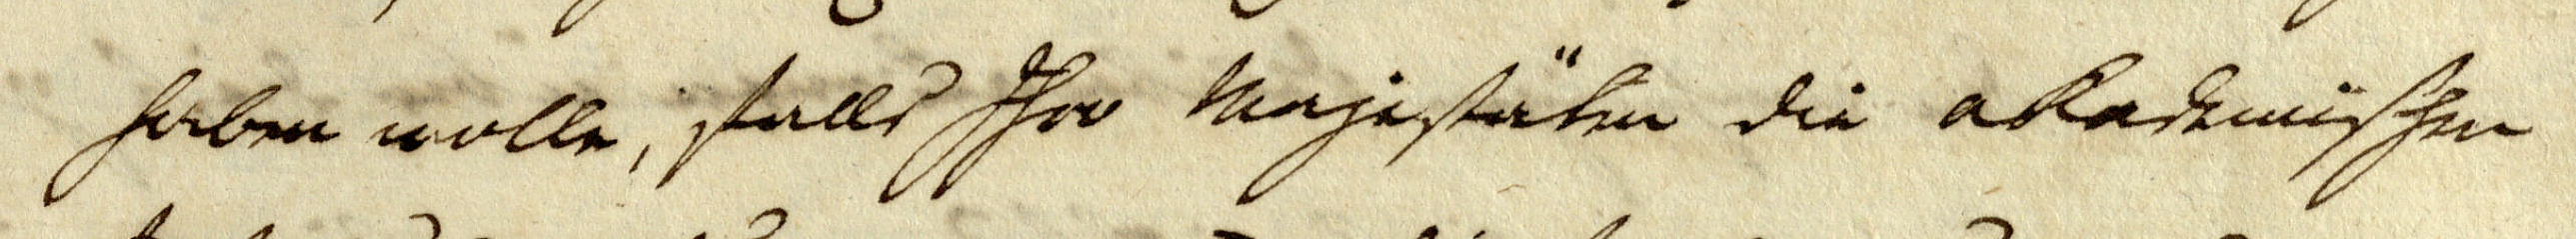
haben wolle, falls Ihro Majestäten die akademischen
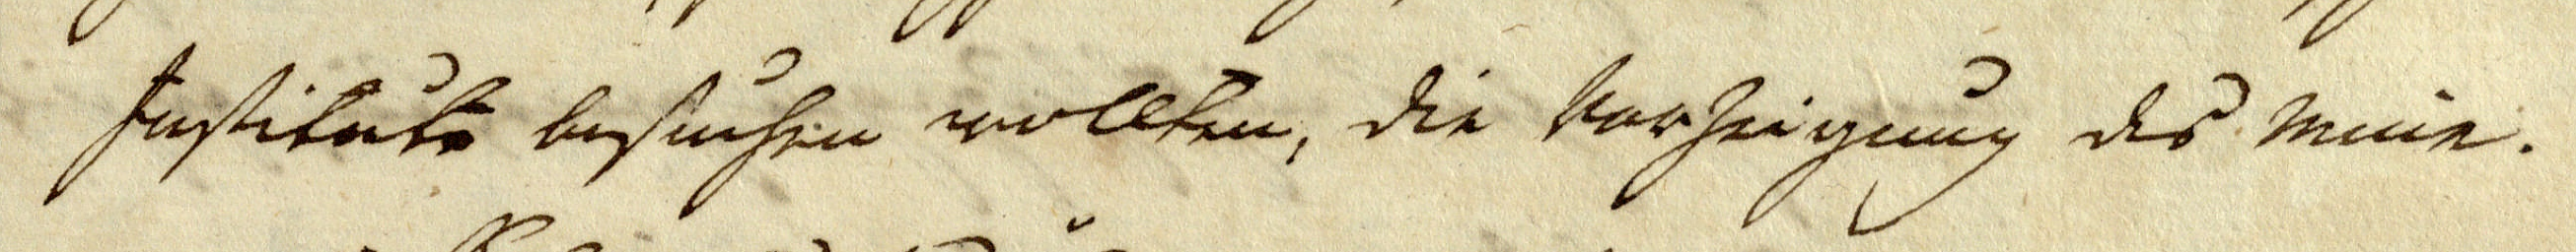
Institute besuchen wollten, die Vorzeigung des Mine¬
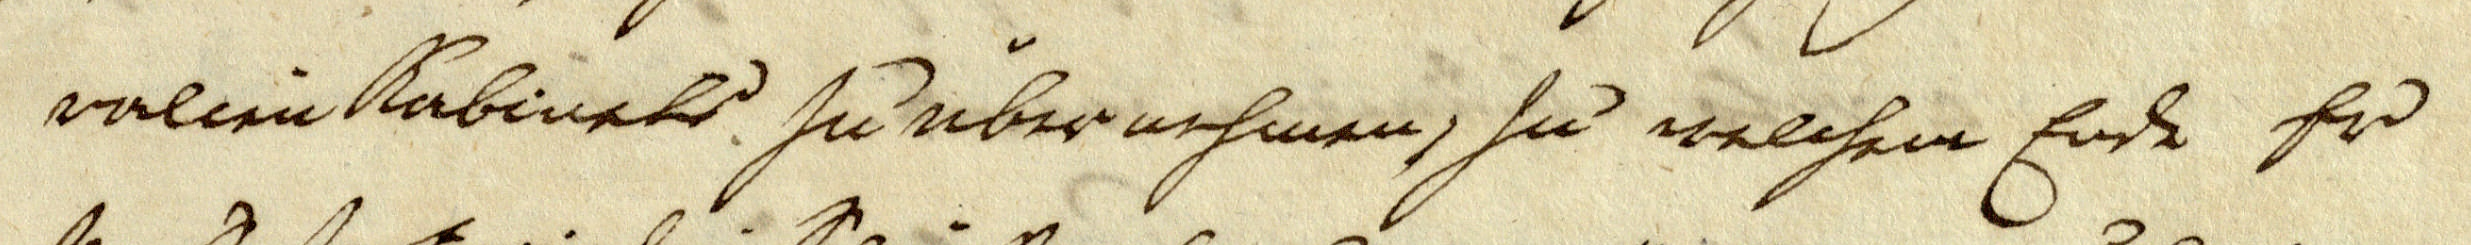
ralienKabinets zu übernehmen, zu welchem Ende Er
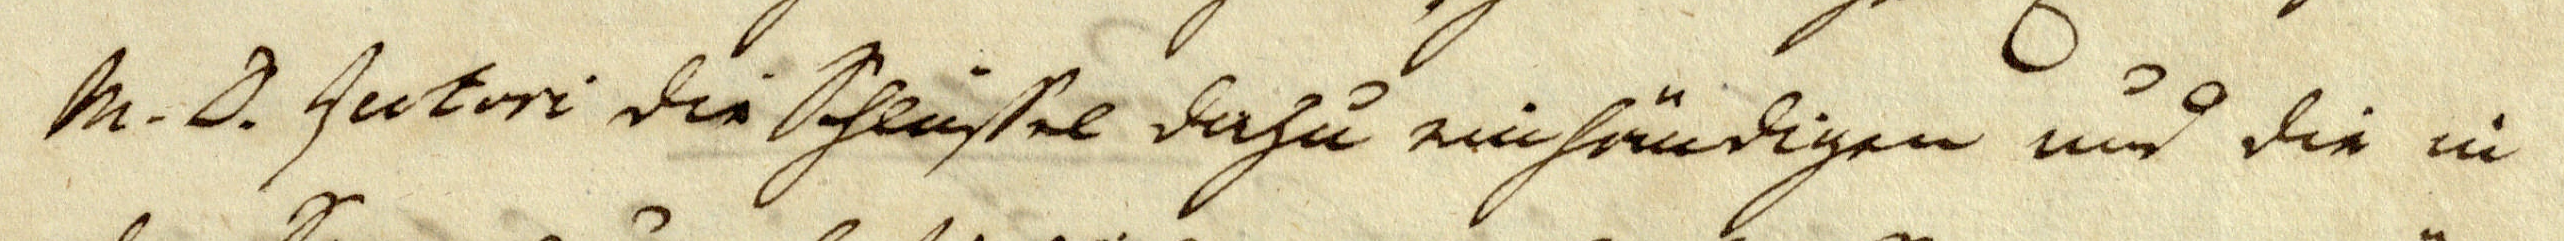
M. D. Rectori die Schlüssel dazu einhändigen und die in
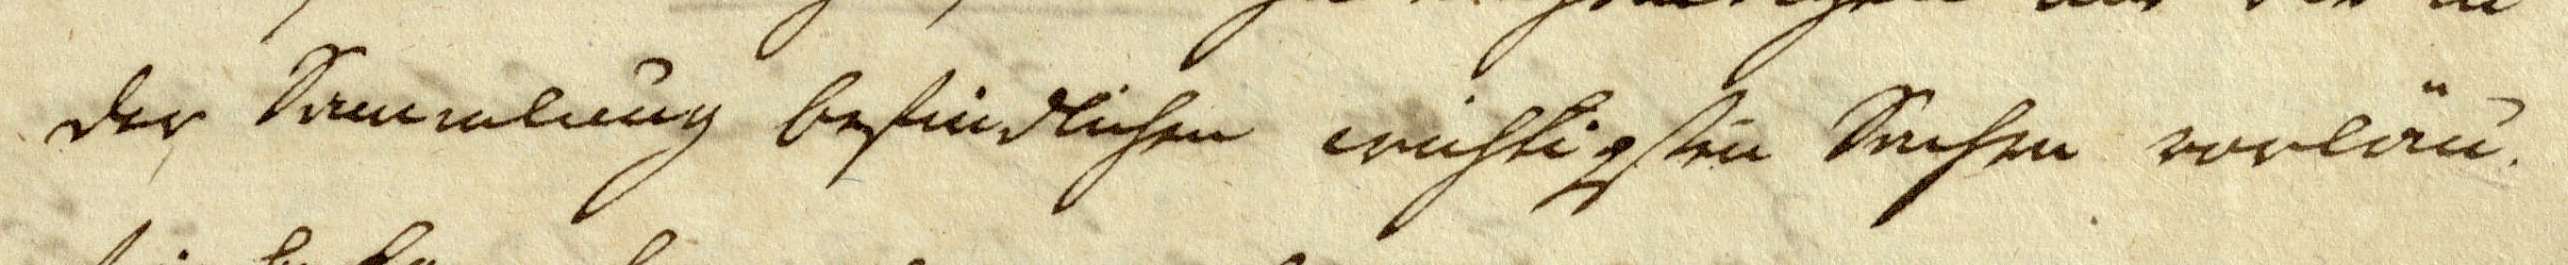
der Sammlung befindlichen wichtigsten Sachen vorläu¬
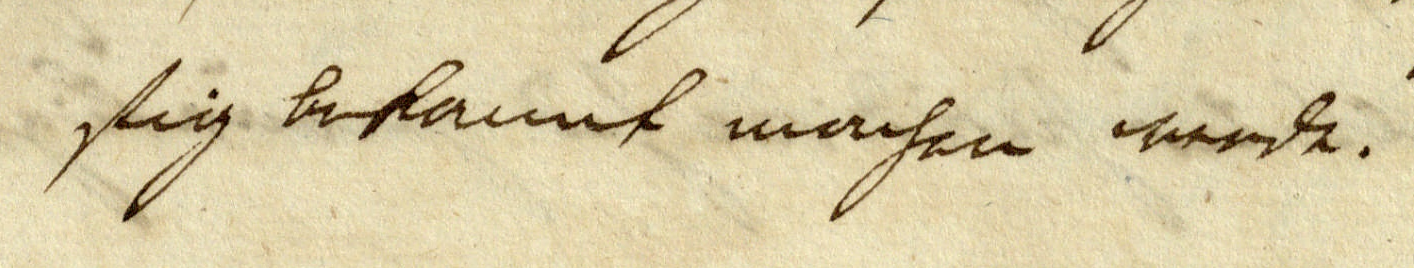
fig bekannt machen werde.
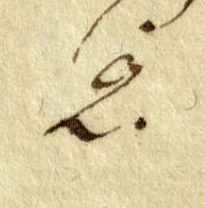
2.
